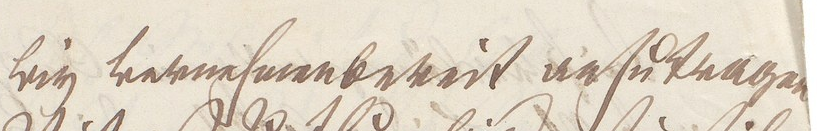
wir vernehmen bereit anzutragen
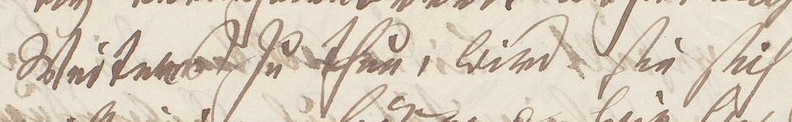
Weiteres zu thun, wird sie sich
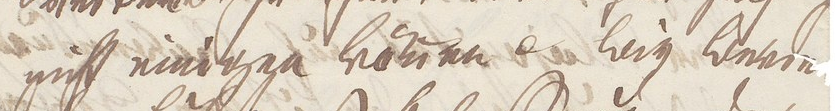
nicht einigen können & wir werden
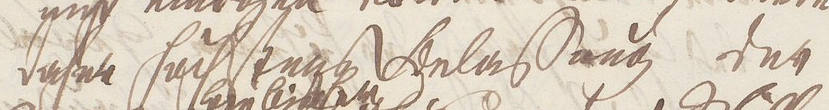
daher höchstens Belassung der
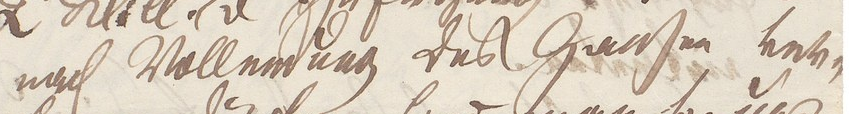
nach Vollendung des Ganzen ver-
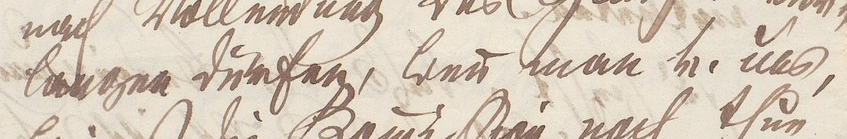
langen dürfen, wenn man v. uns,
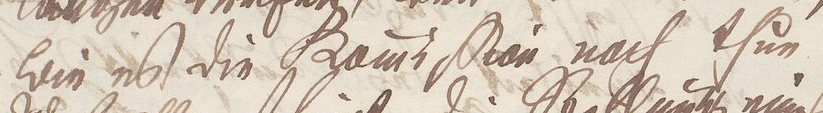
wie es die Kommission noch thun
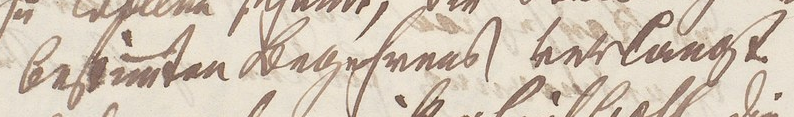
bestimmten Begehrens verlangt.
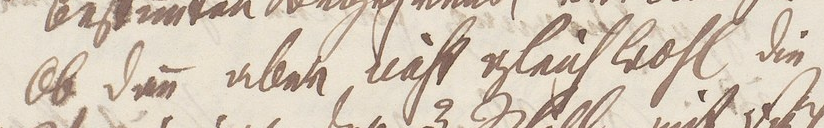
Ob dann aber nicht gleichwohl die
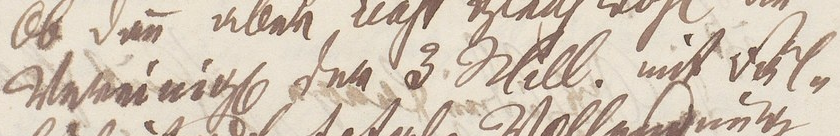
Vereinigung der 3 Mill. mit Fäl-
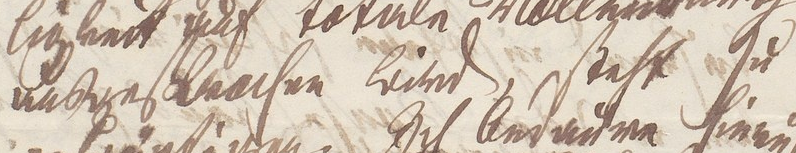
ausgesprochen wird, steht zu
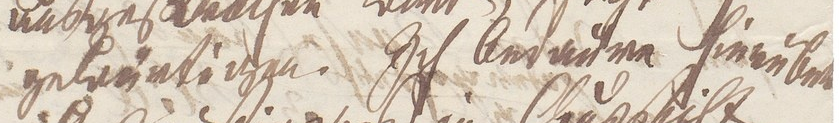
gewärtigen. Ich bedaure hierüber
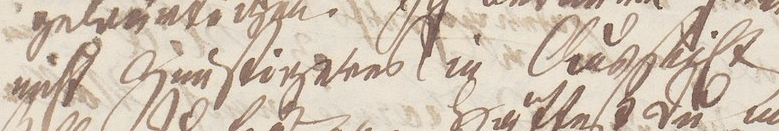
nicht Günstigeres in Aussicht
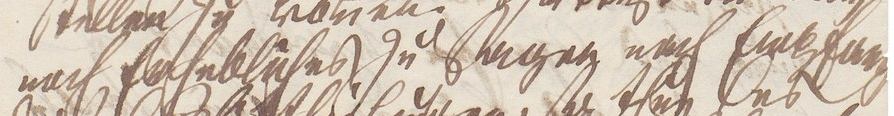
noch Erhebliches zu sagen nach Empfang
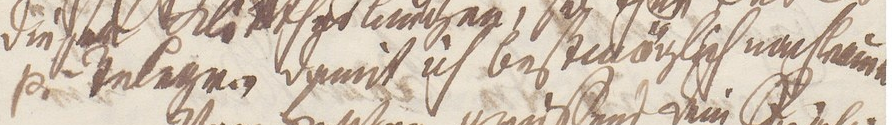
p. Telegr., damit ich bestmöglich nachkomme.
